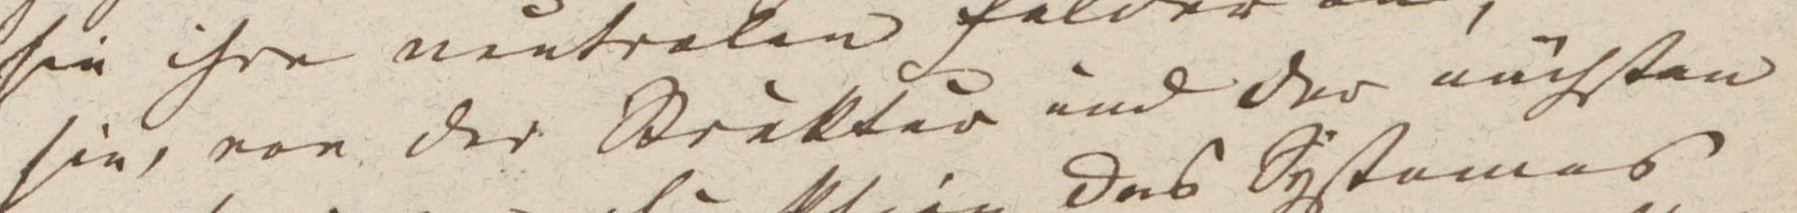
sie, von der Struktur und der nächsten
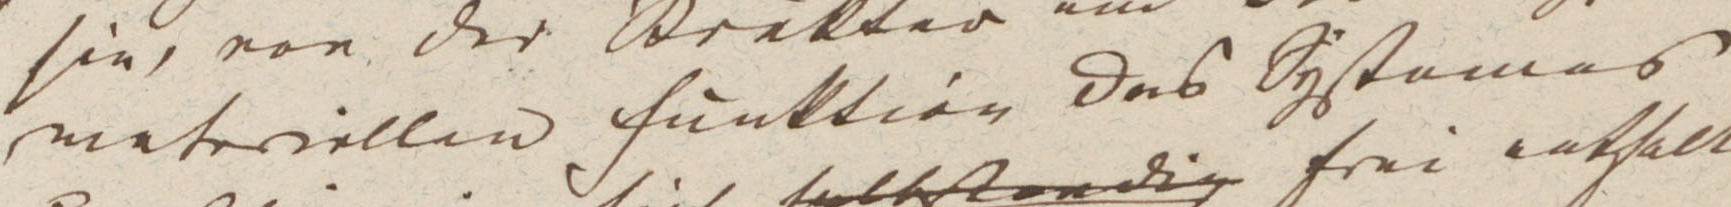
materiellen Funktion des Systemes
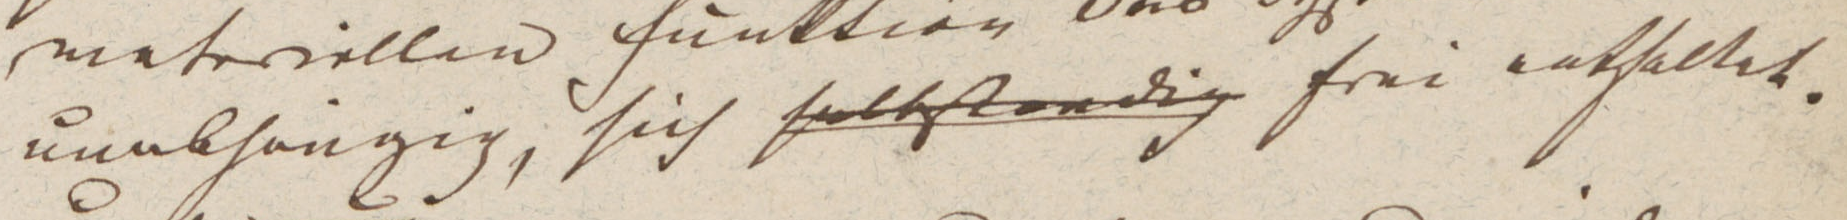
unabhängig, sich selbstandig frei entfaltet.
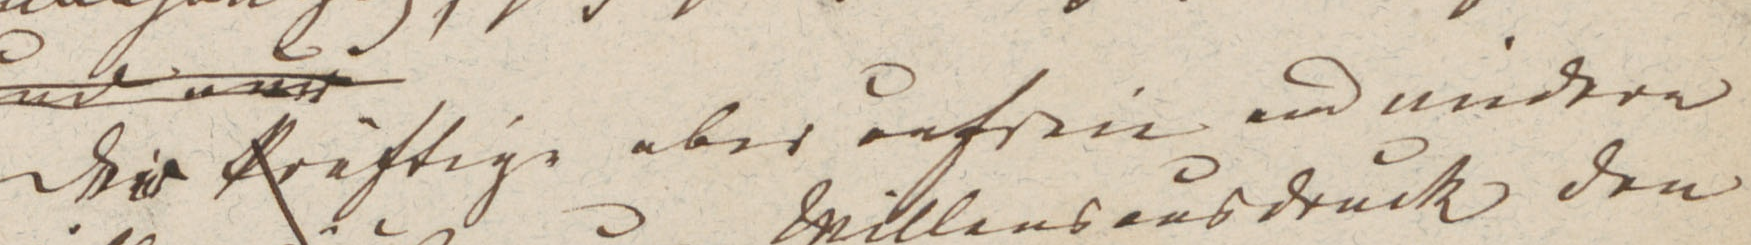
Dieer kräftige aber unfreie und niedere
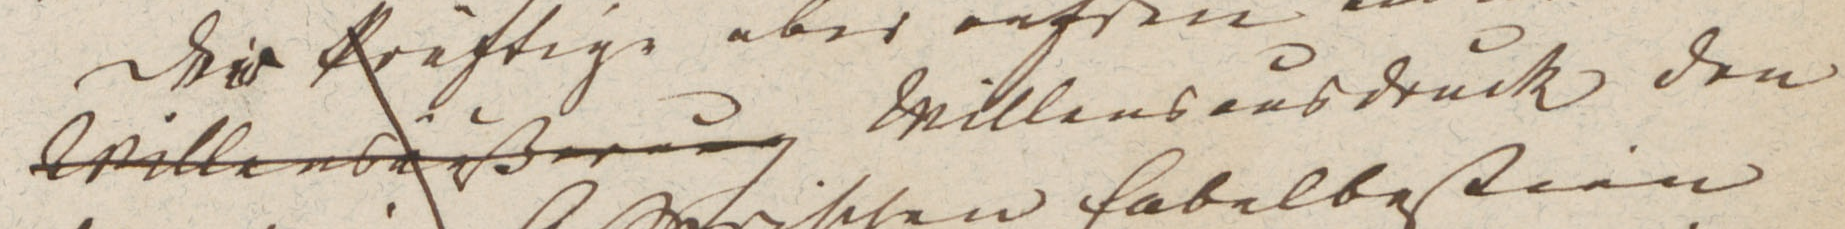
Willensäusserung Willensausdruck den
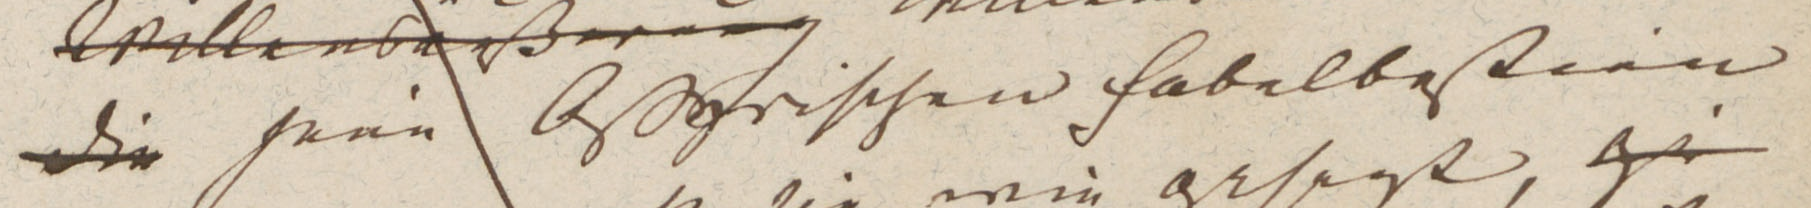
die jene Assyrischen Fabelbestien
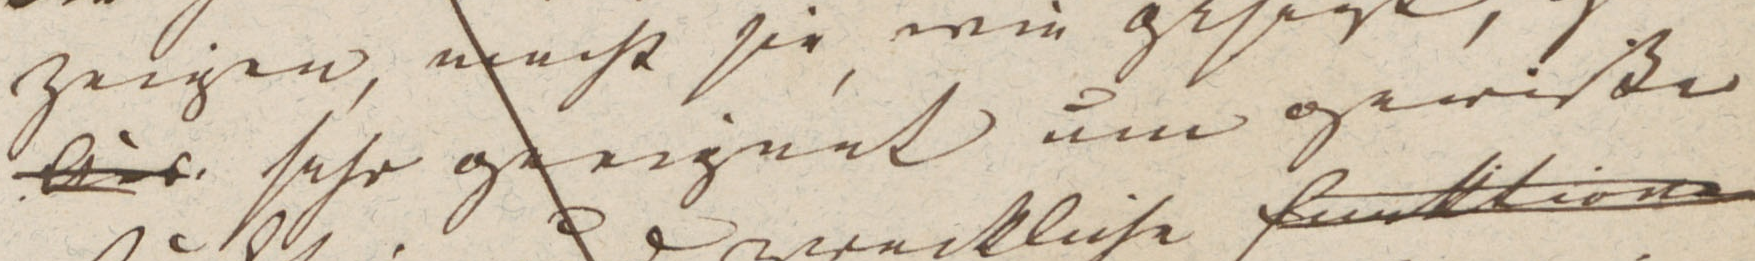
Aus sehr geeignet um gewisse
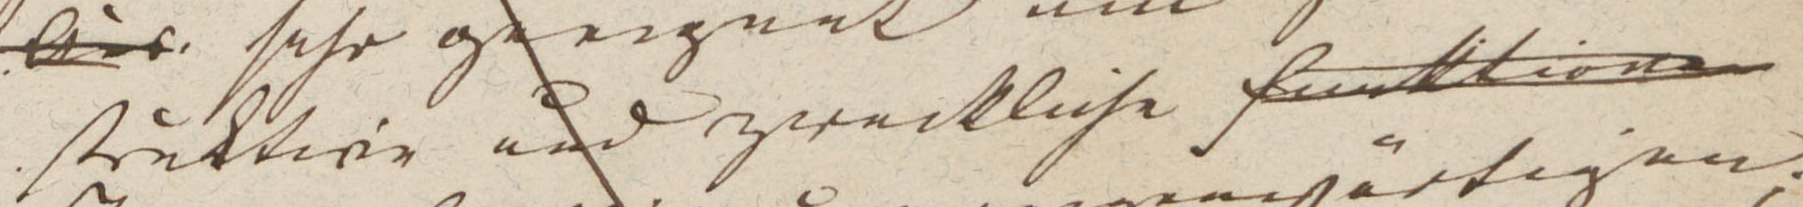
struktive und zweckliche Funktionen
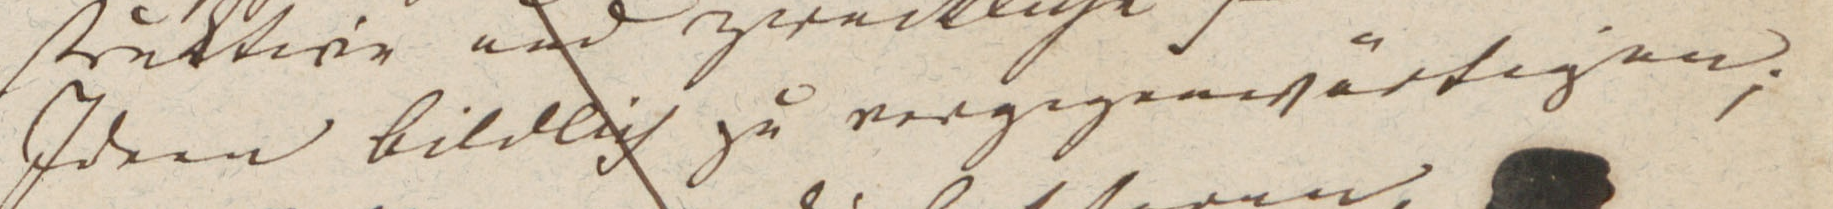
Ideen bildlich zu vergegenwärtigen;
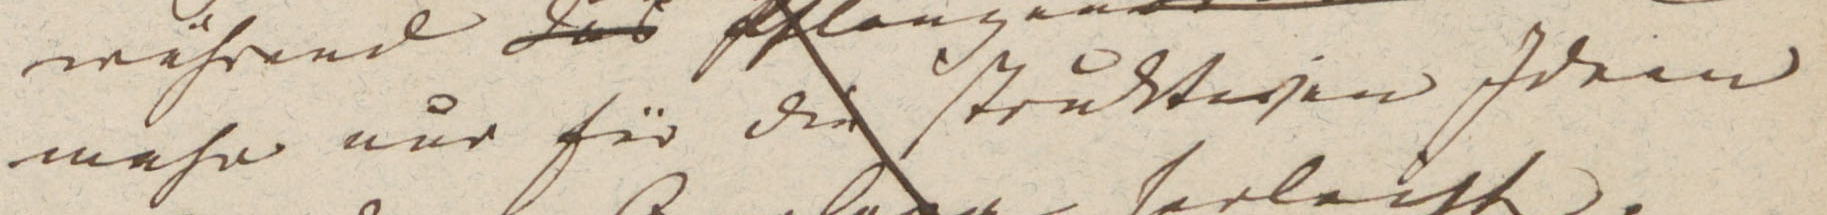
mehr nur für die struktiven Ideen
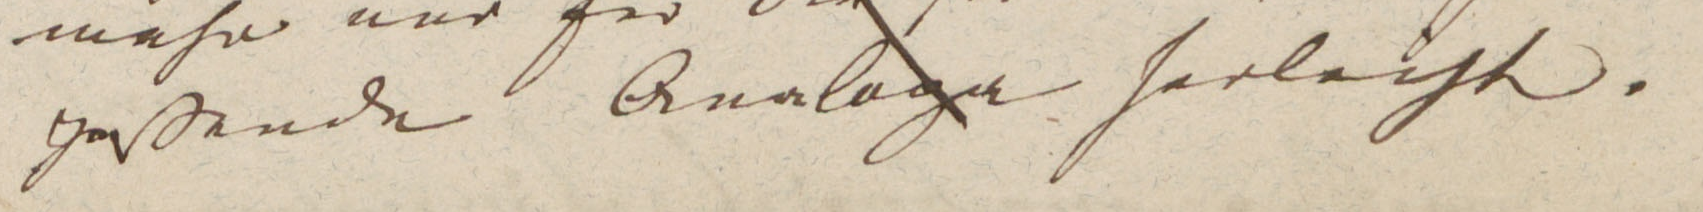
passende Analoga herleiht.
